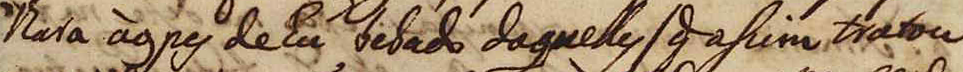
lhara àos pes de hū bebado daquelles / q̄ assim tratou
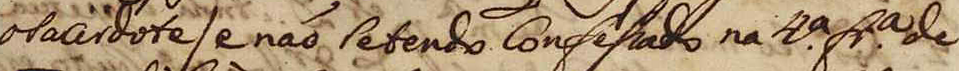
o sacerdote / e naõ se tendo confessado na 4.a fr.a de
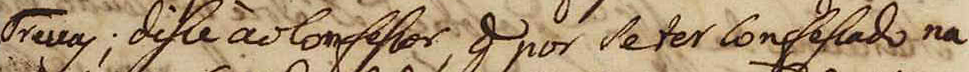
Treuas; disse ao Confessor, q̄ por se ter confessado na
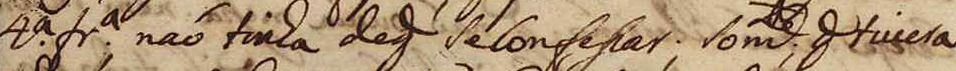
4.a fr.a; naõ tinha de q̄ se confessar; som;te q̄ tiuera
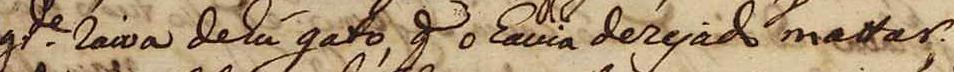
gr.de Raiva de hū gato, q̄ o hauia dezejado mattar;
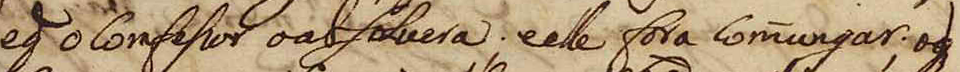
e q̄ o Comfessor o absoLuera; e elle fora com̄ungar; o q̄
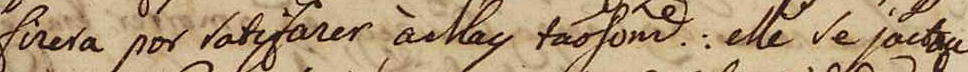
fizera por satisfazer à May tãosom.te: elle se jactou
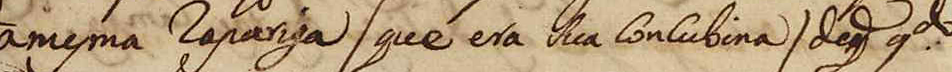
à mesma Rapariga / que era sua concubina / de q̄ q.do
